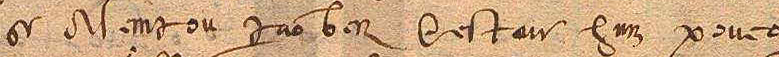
se Asemtou tão bem e esteue hum pouco
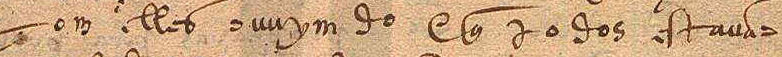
com elles ouuymdo e q̅ todos estauão
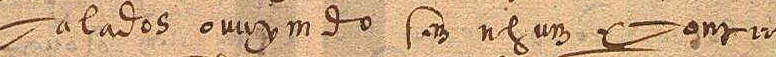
Calados ouuymdo sem nhum contra
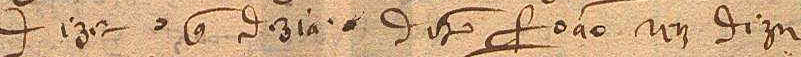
dizer o que dezia o dito foão nem dizer
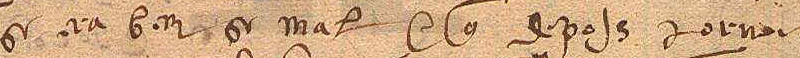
se era bem se mal e q̅ depojs tornou
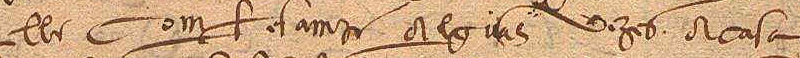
elle comfesamte Algu̅as vezes A casa
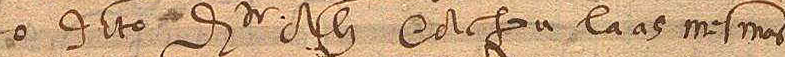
do di̅to d̅te Al̅z e Achou la as mesmas
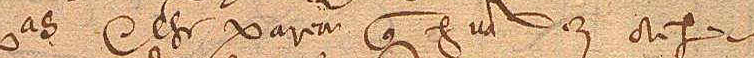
pas e lhe pareçe q̅ hu̅a vez Achou
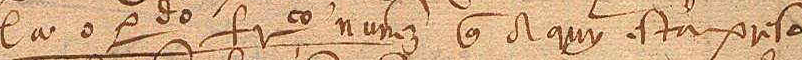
la o Ldo frco nun̅ez q̅ Aquy esta preso
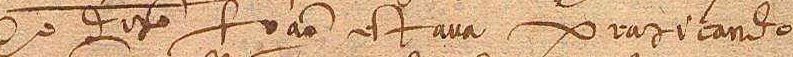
e o dito joão estaua praticando
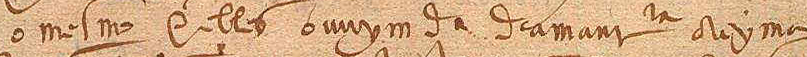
o mesmo e elles ouuymdo da manera Acyma
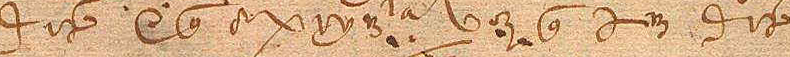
dit̅o e q̅ a prymra vez q̅ tem dito
